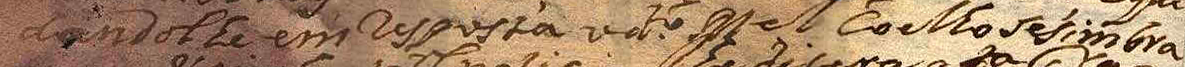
dandolhe em Resposta o d̄.o Mel Coelho sesimbra
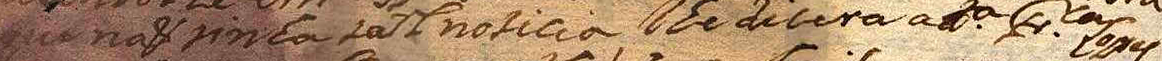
que naõ tinha tal noticia, lhe dicera a d̄.a Fr.cas Lopes
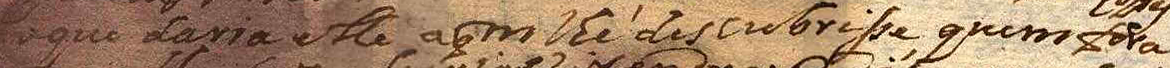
o que daria elle a qm lhe descubrisse quem fora
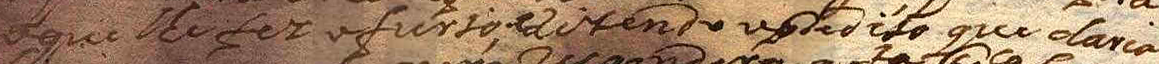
o que lhe fez o furto; e dizendo o pRedito que daria
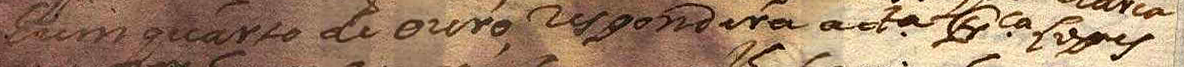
hum quarto de ouro, Respondera a d̄.a Fr.ca Lopes
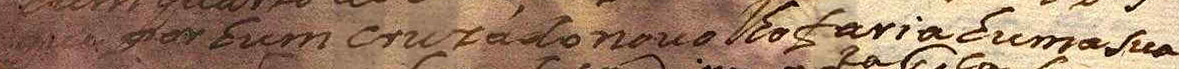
que por hum cruzado nouo lho faria huma sua
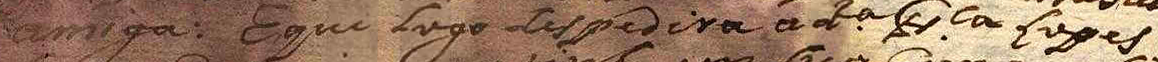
amiga: E que logo despedira a d.a Fr.ca Lopes
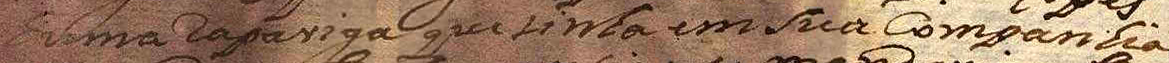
huma Rapariga que tinha em sua companhia
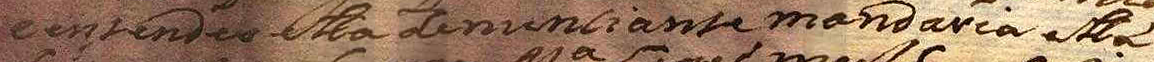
e entendeo ella denunciante mandaria ella
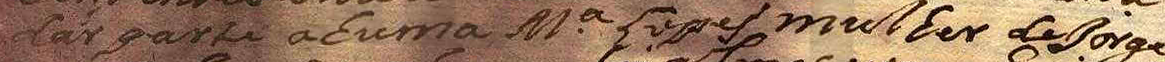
dar parte a huma M.a Lopes mulher de Jorge
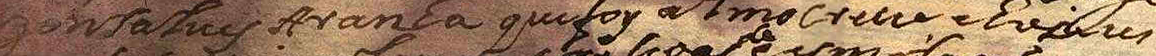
gonsalues Aranha que foy almocreue, e hoie ui
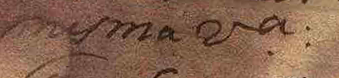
mesma v.a:
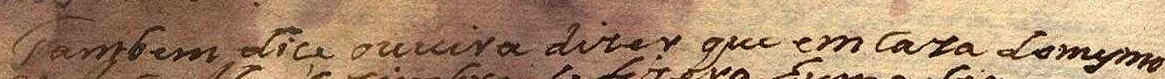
Tambem dice ouuira dizer que em caza do mesmo
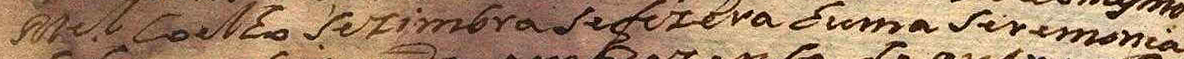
Me.l Coelho sezimbra se fizera huma seremonia
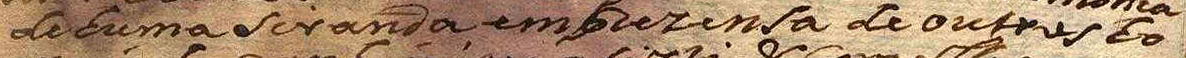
de huma siranda em pRezensa de outros ho
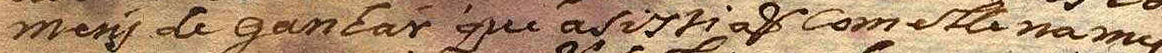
mens de ganhar que asistiaõ com elle na mes
